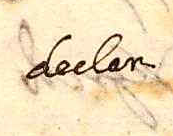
declar
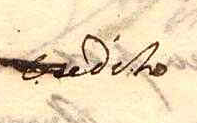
credito
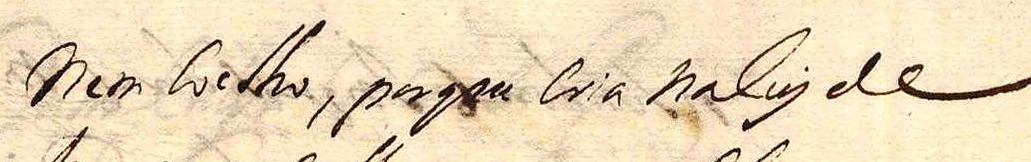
nem Coelho, porque cria na ley de
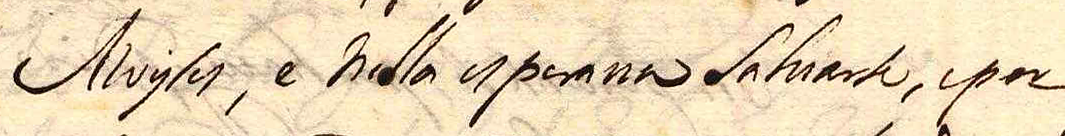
Moyses, e nella esperaua saluarse, e por
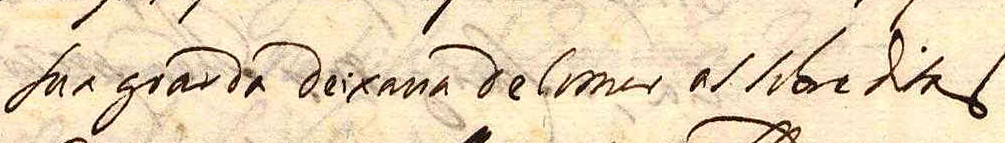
sua goarda deixaua de comer as sobreditas
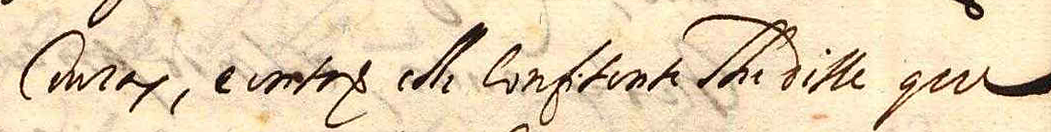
Couzas, e entaõ elle confitente lhe disse que
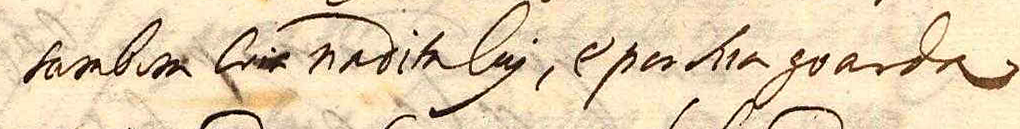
tambem cria na dita ley, e por sua goarda
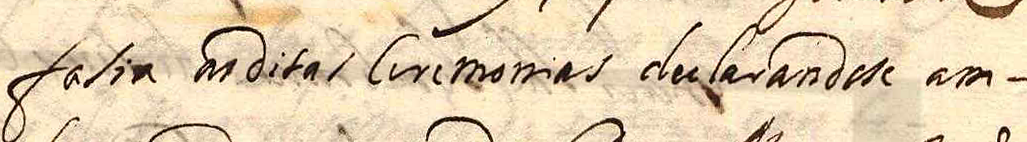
fasia as ditas Ceremonias declarandose am
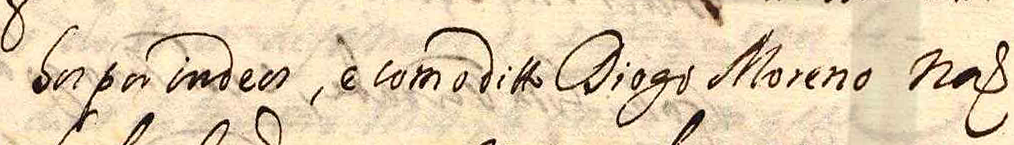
bos por iudeos, e com o ditto Diogo Moreno naõ
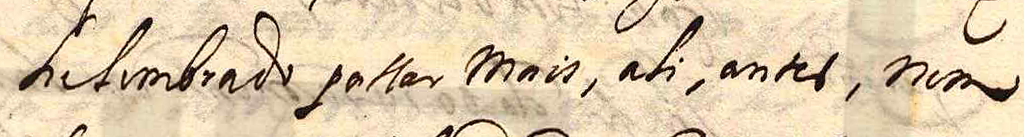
he lembrado passar mais, ali, antes, nem
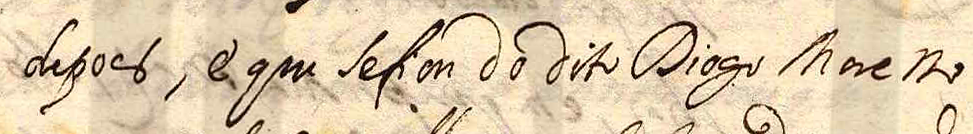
depoes, e que se fiou do dito Diogo Moreno
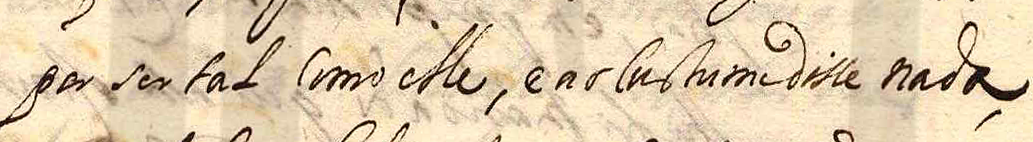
por ser tal como elle, e ao Custume disse nada,
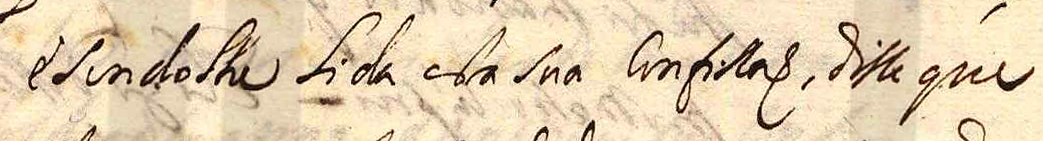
e sendolhe lida esta sua confissaõ, disse que
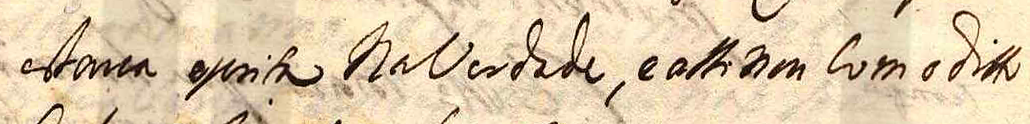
estaua escrita na Verdade, e assinou com o ditto
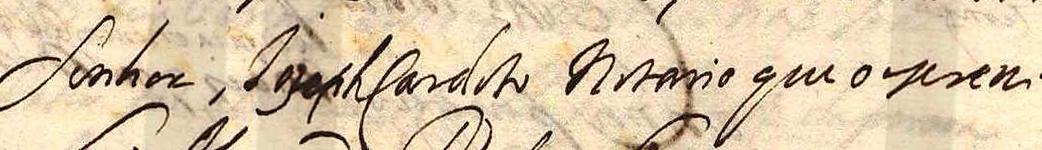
Senhor, Ioseph Cardoso Notario que o escreui
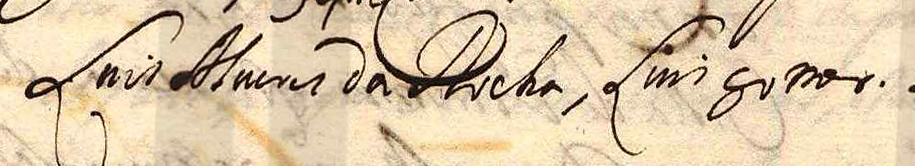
Luis Alueres da Rocha, Luis gomes
